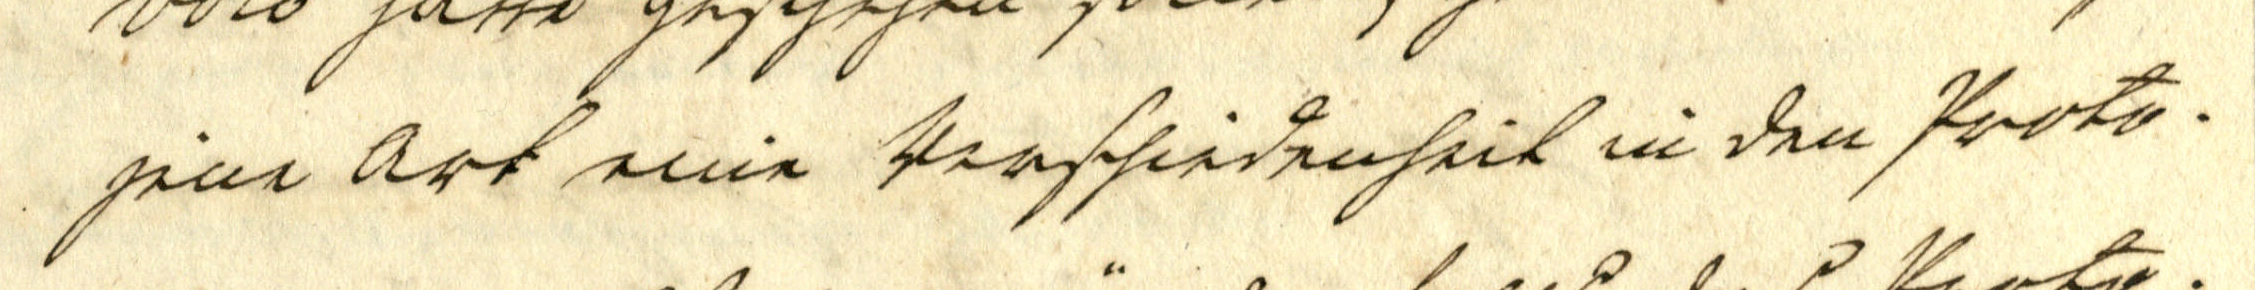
jene Art eine Verschiedenheit in den Proto¬
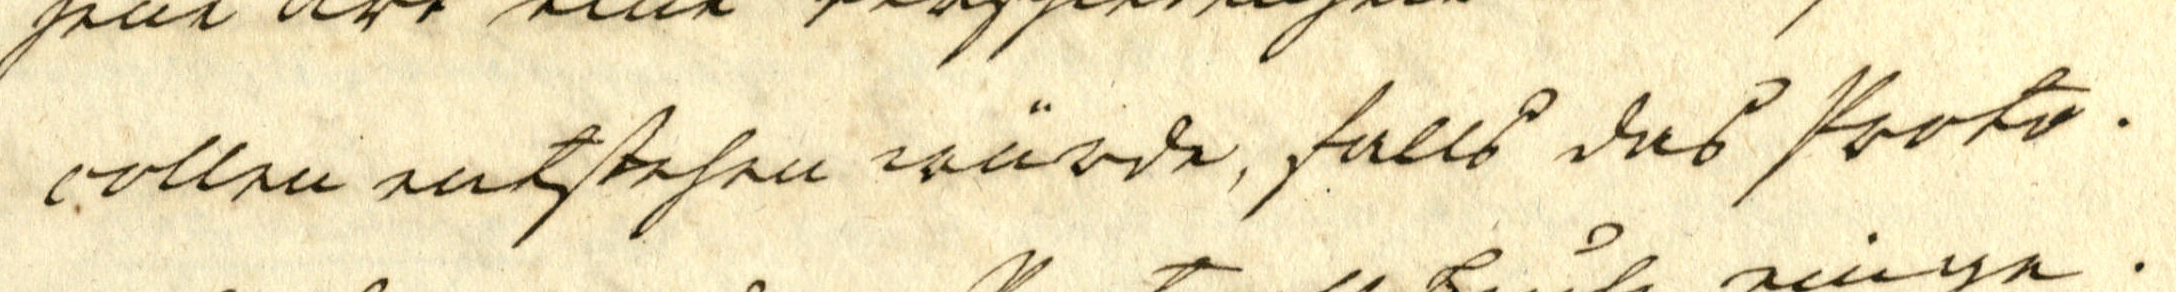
collen entstehen würde, falls das Proto¬
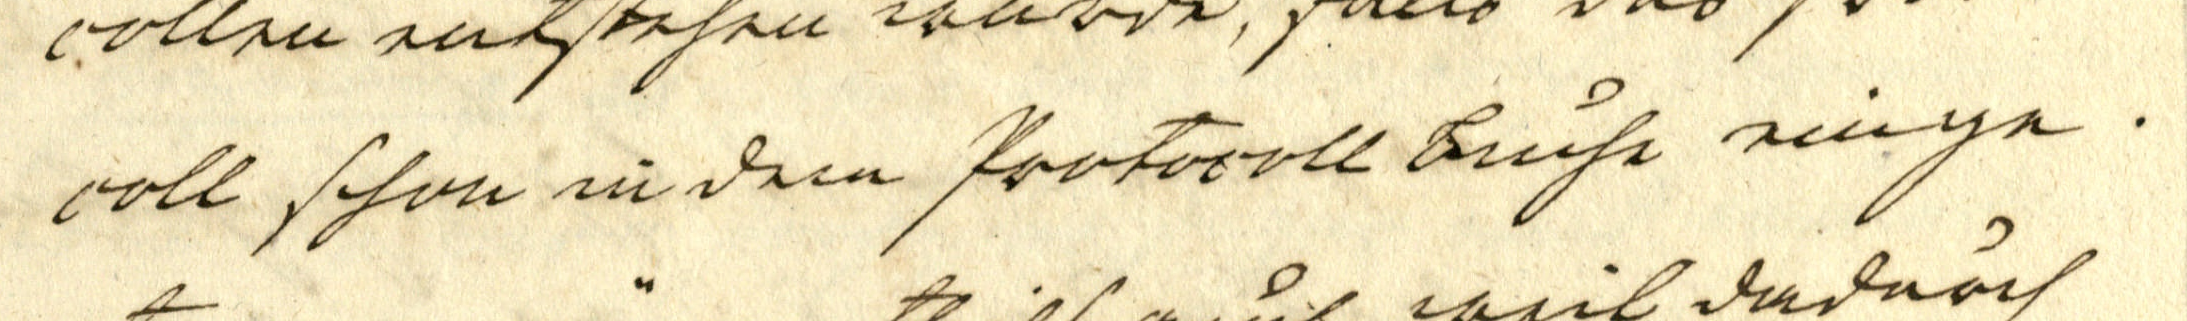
coll schon in dem Protocoll Buche einge¬
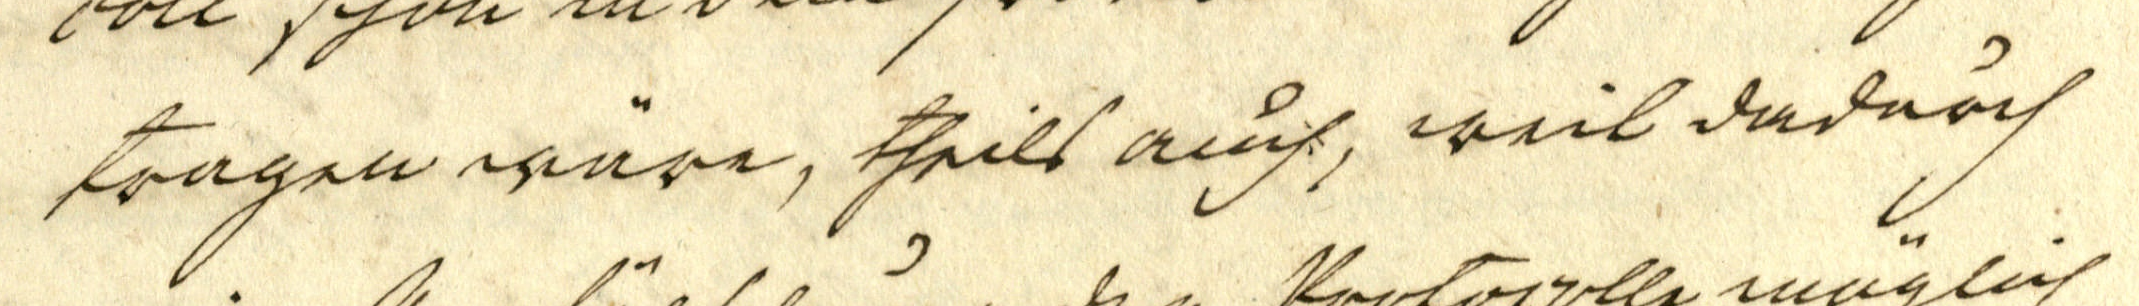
tragen wäre, theils auch, weil dadurch
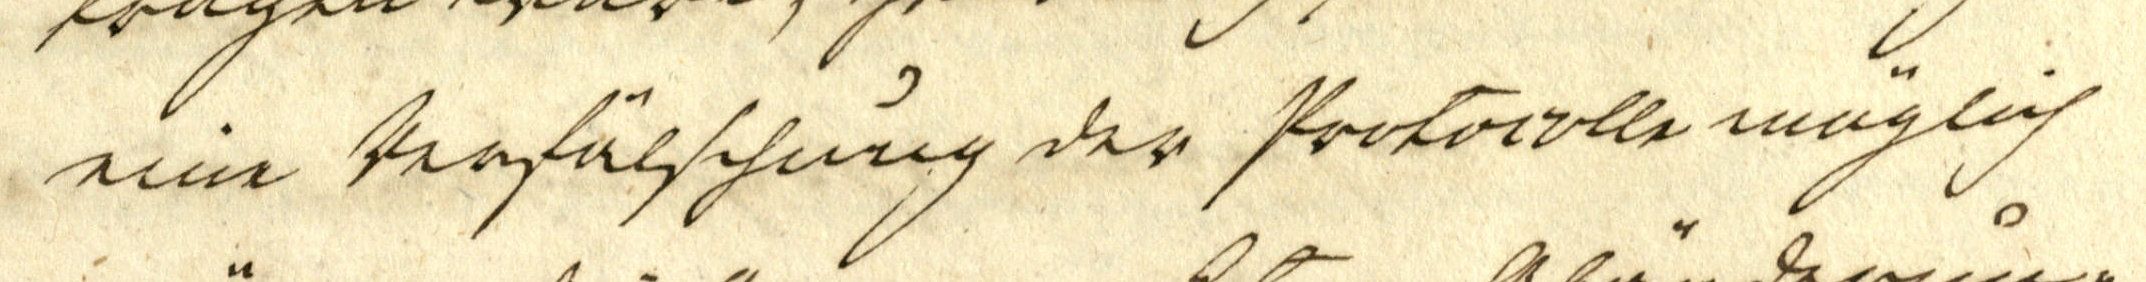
eine Verfälschung der Protocolle möglich
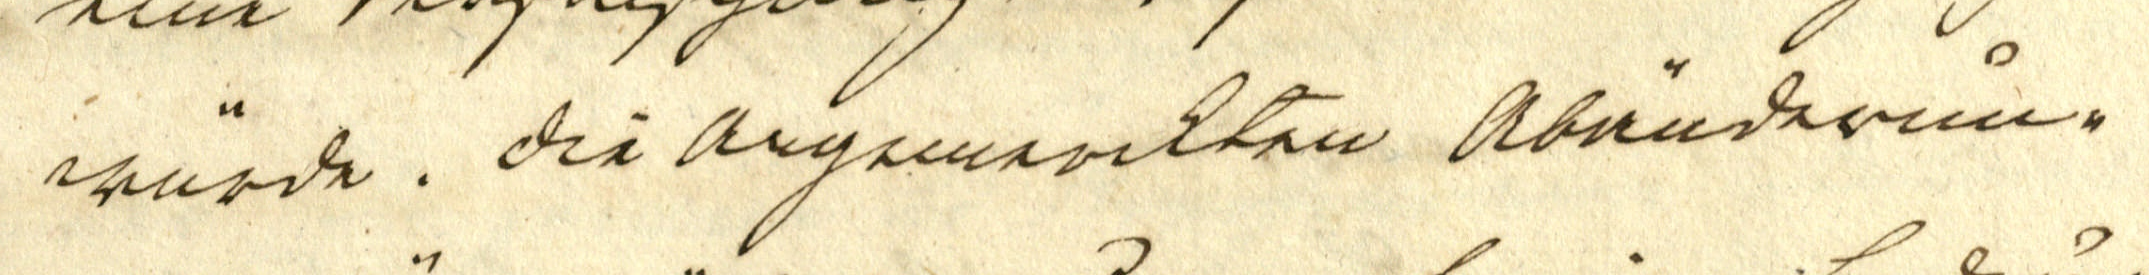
würde. die Angemerckten Abänderun¬
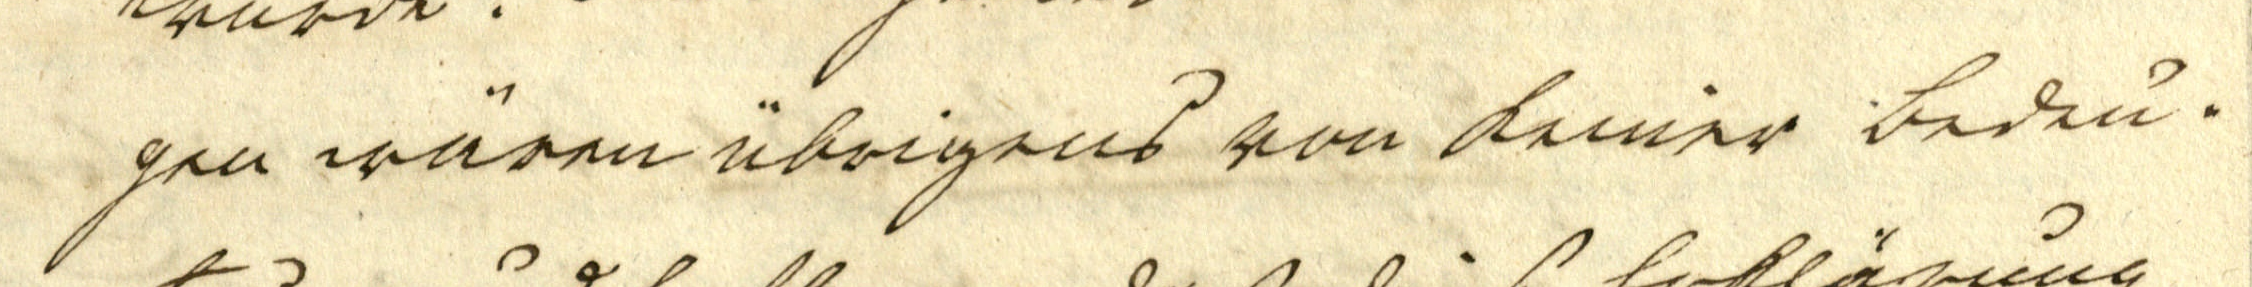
gen wären übrigens von keiner Bedeu¬
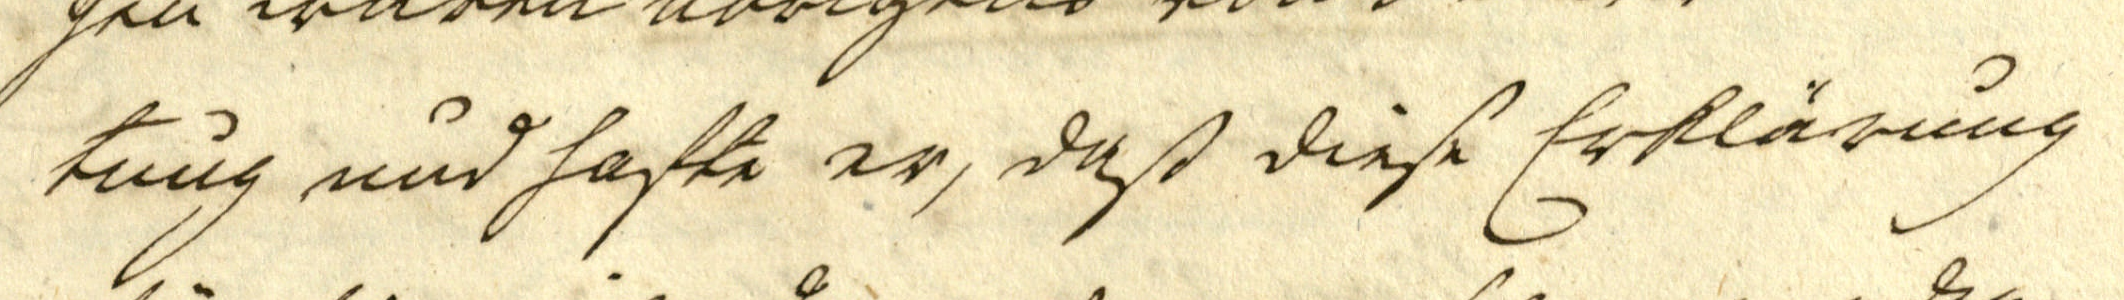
tung und hofte er, daß diese Erklärung
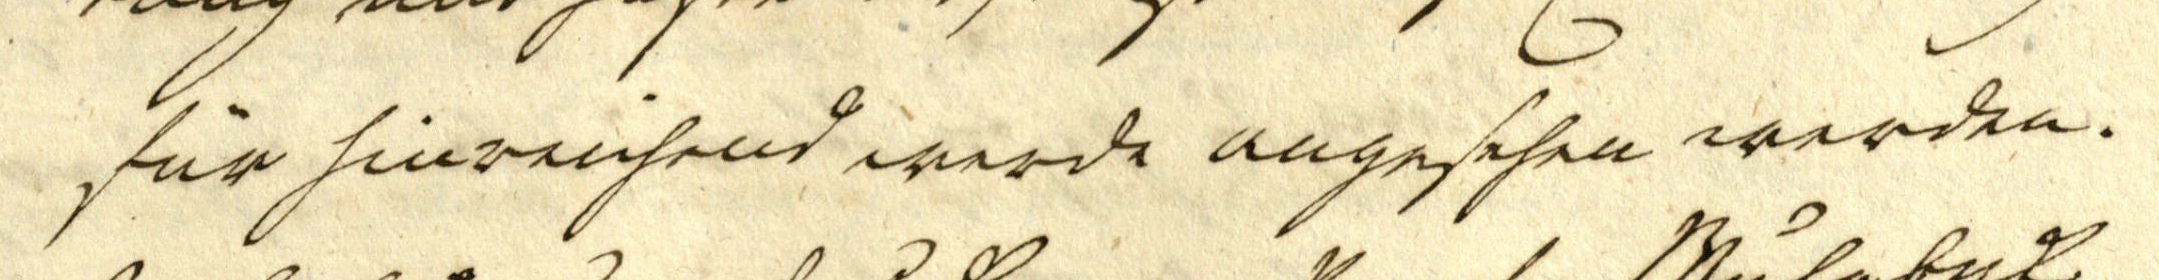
für hinreichend werde angesehen werden.
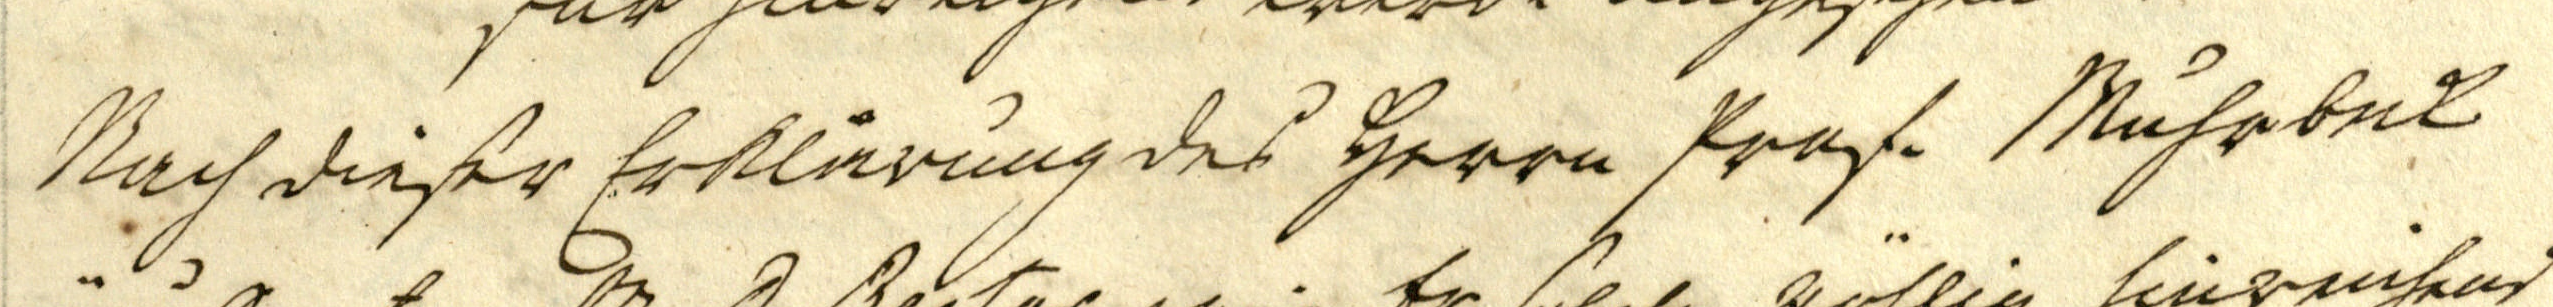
Nach dieser Erklärung des Herrn Prof. Muhrbeck
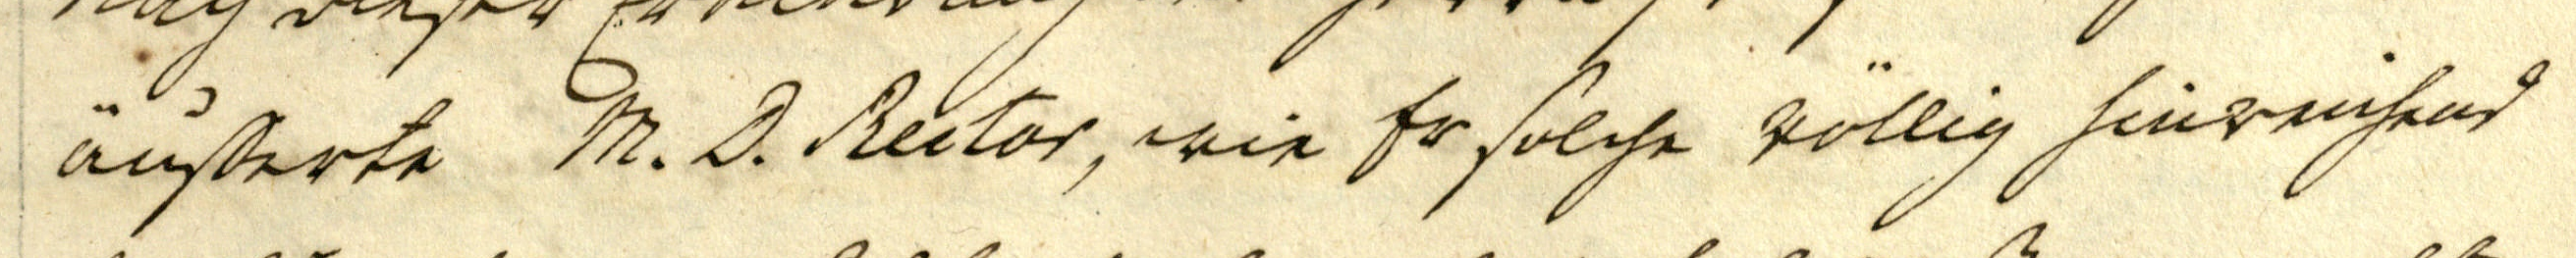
äusserte M. D. Rector, wie Er solche völlig hinreichend
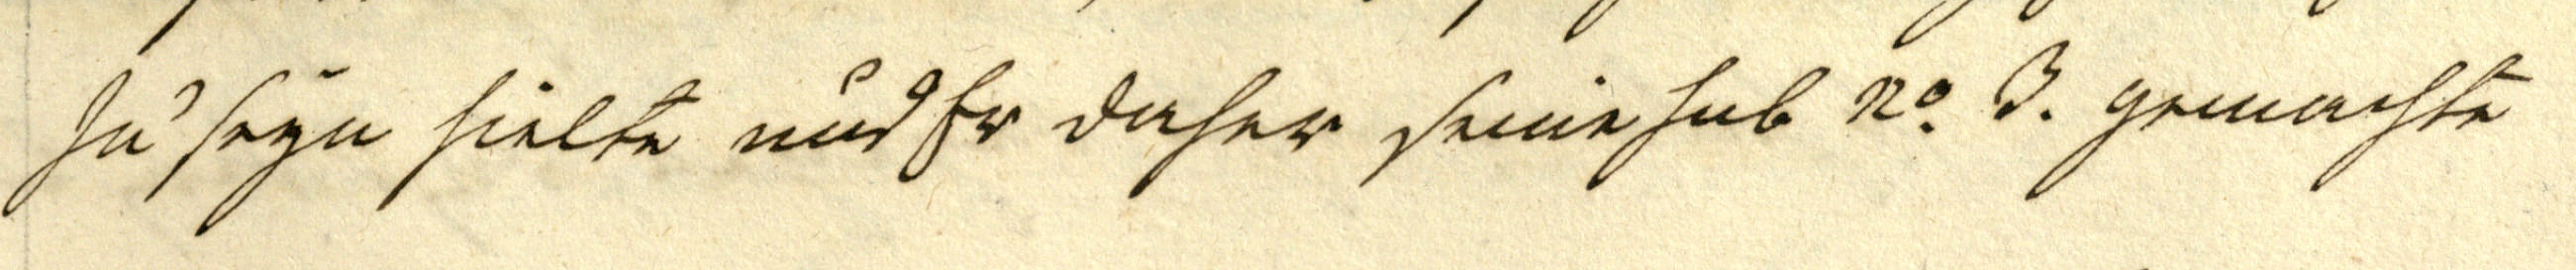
zu seÿn hielte und Er daher seine sub No. 3. gemachte
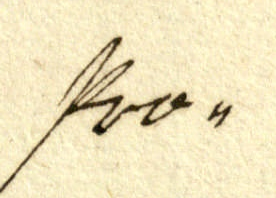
Pro¬
